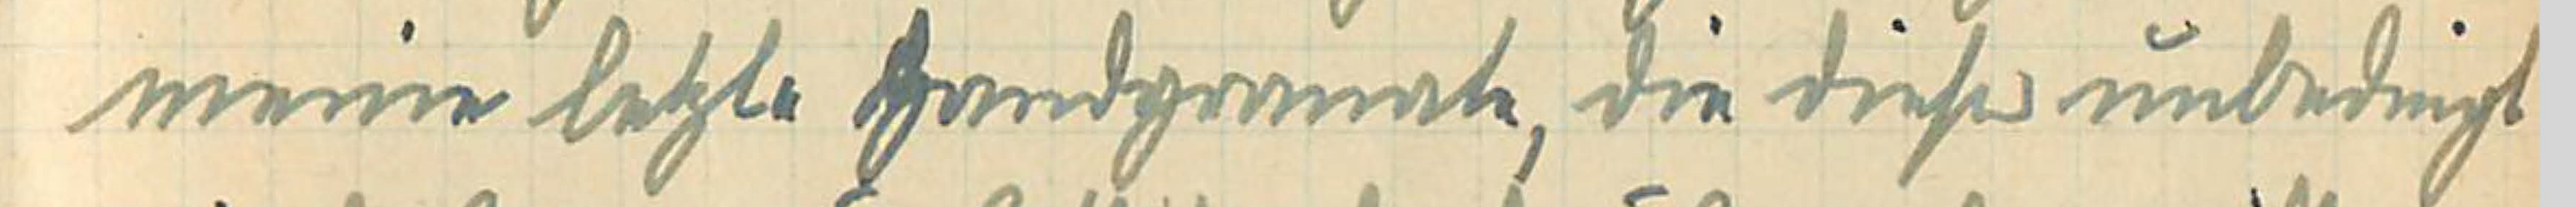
meine letzte Handgranate, die dieser unbedingt
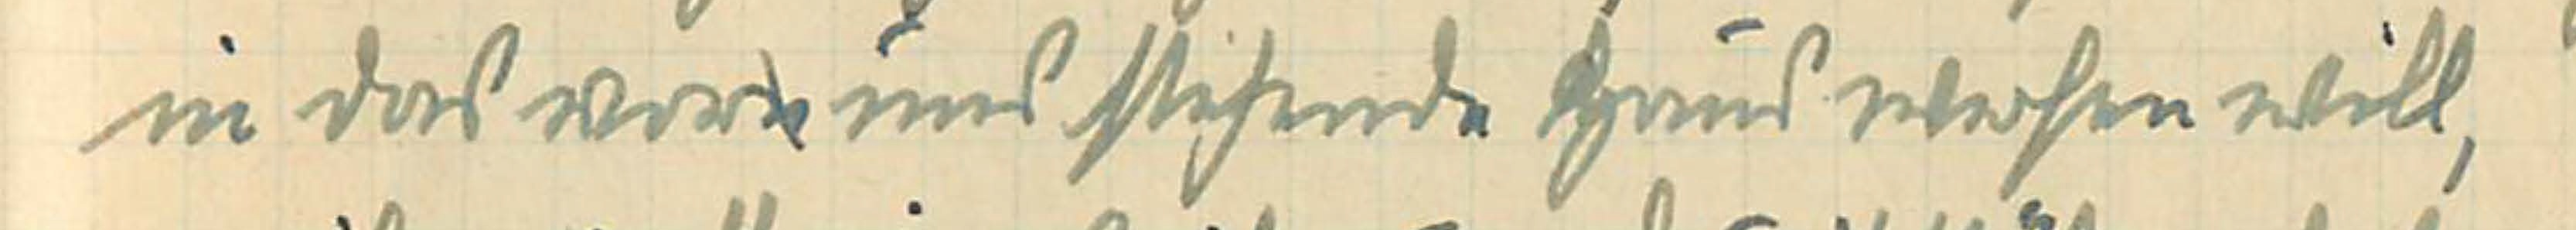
in das vorn uns stehende Haus werfen will,
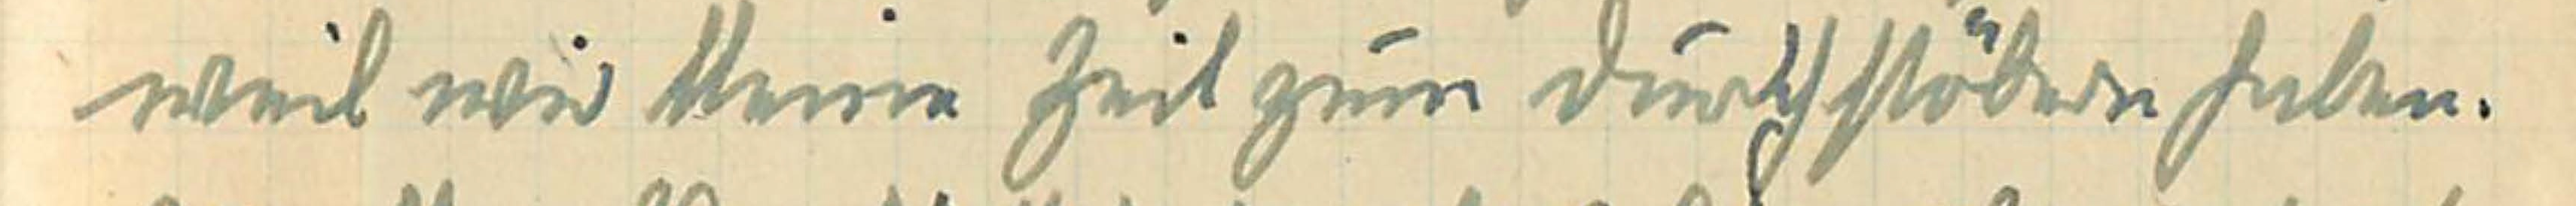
weil wir keine Zeit zum Durchstöbern haben.
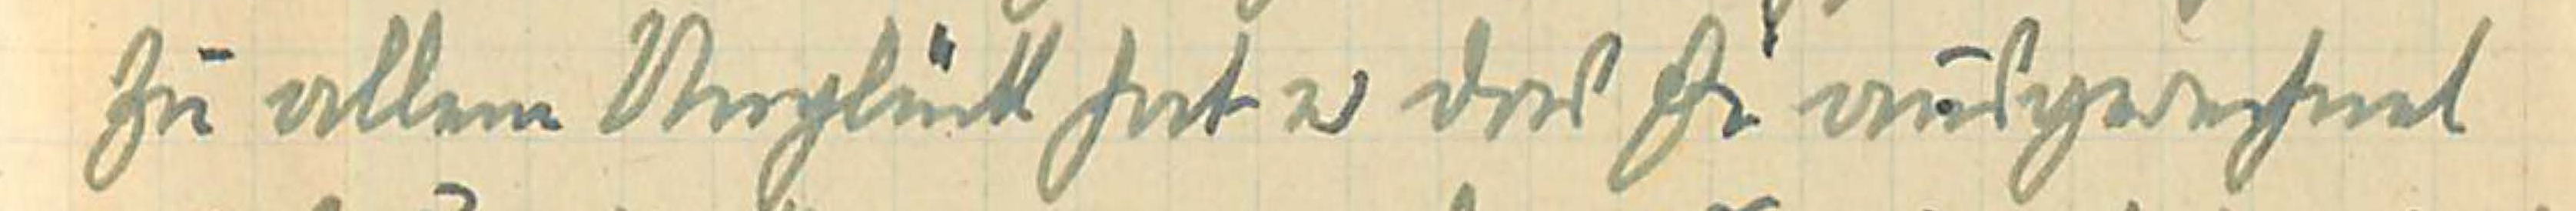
Zu allem Unglück hat er das Ei ausgerechnet
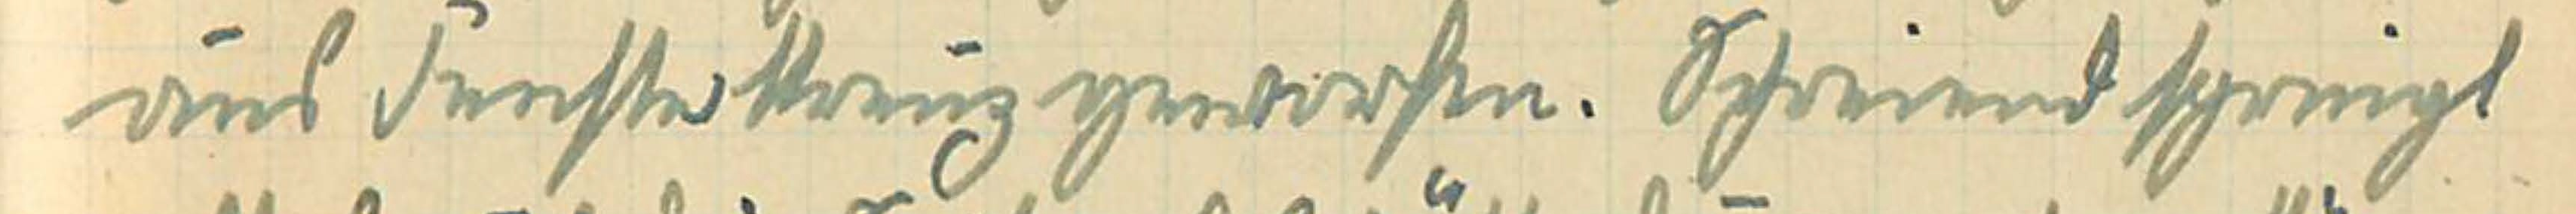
ans Fensterkreuz geworfen. Schreiend springt
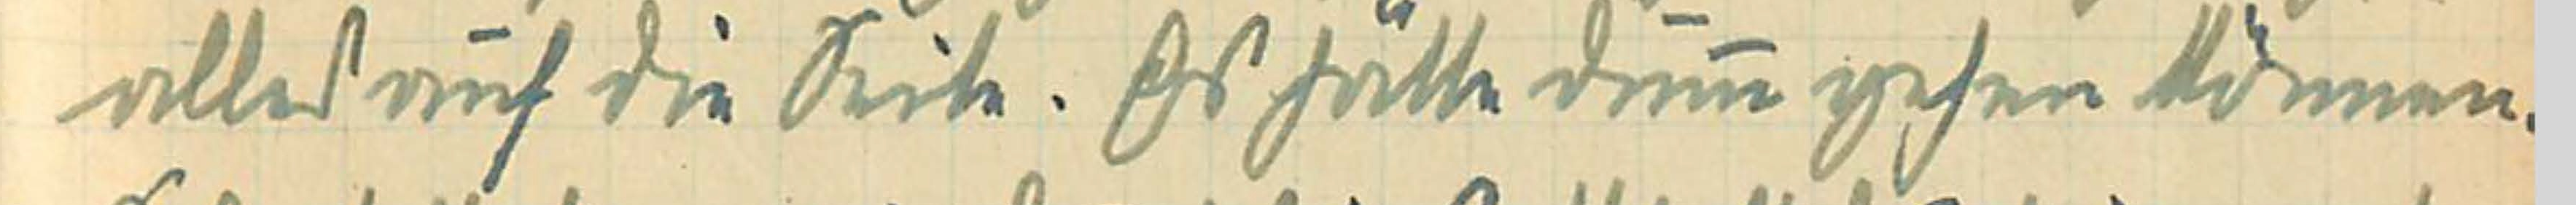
alles auf die Seite. Es hätte dumm gehen können.
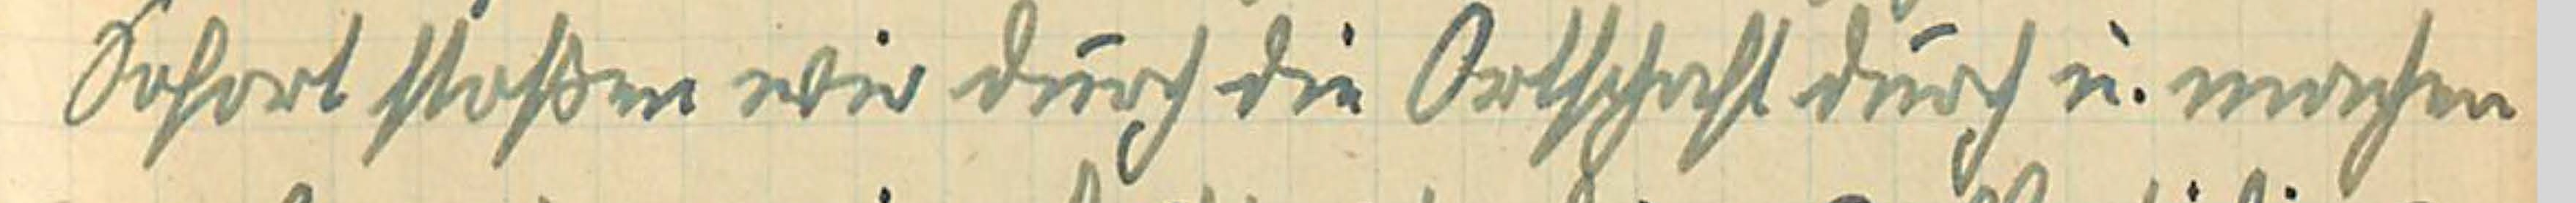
Sofort stoßen wir durch die Ortschaft durch u. machen
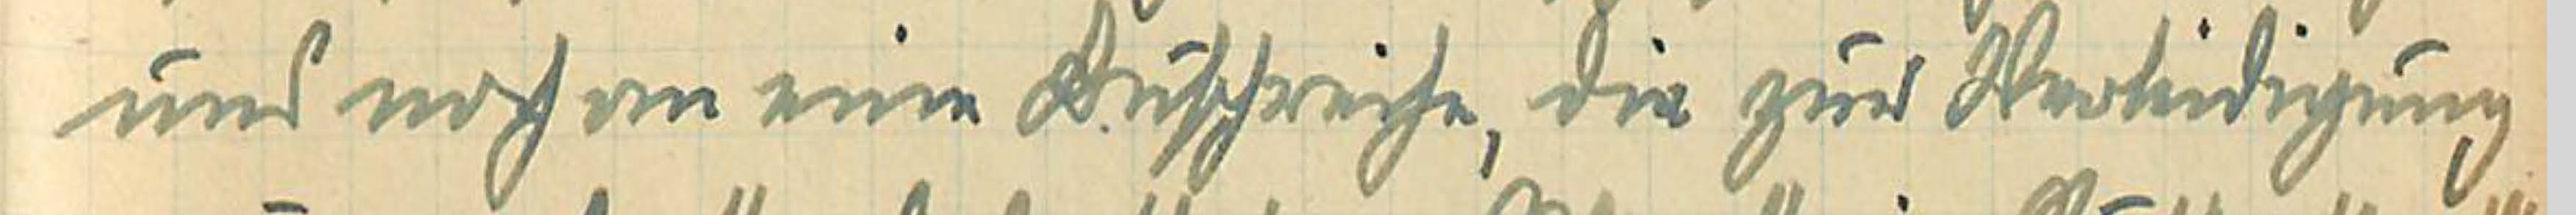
uns noch an eine Buschreihe, die zur Verteidigung
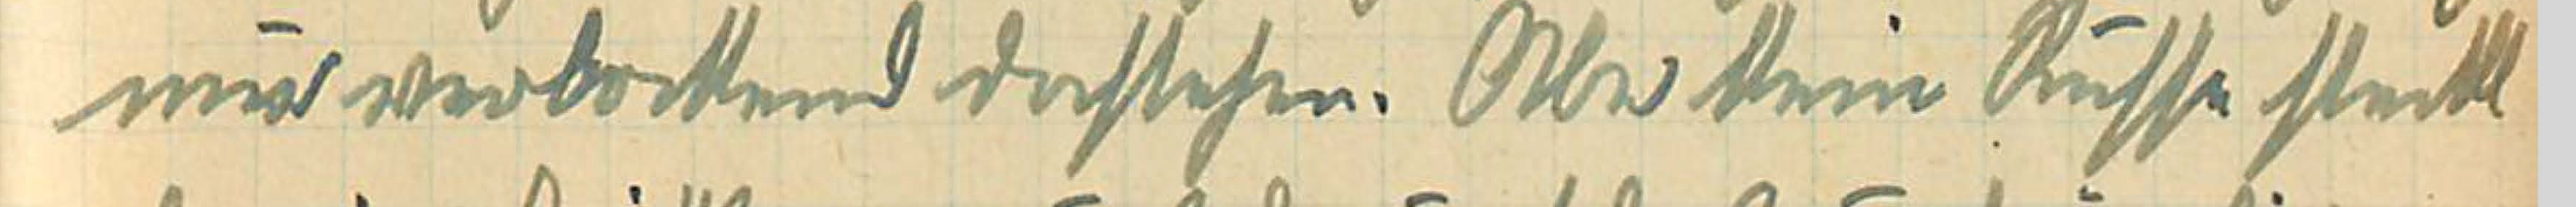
nur verlockend dastehen. Aber kein Russe steckt
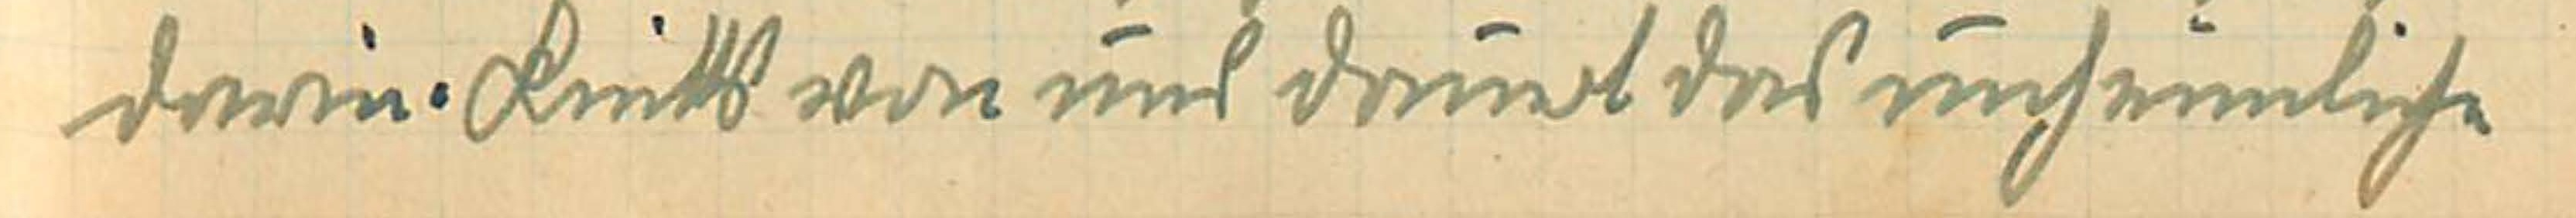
darin. Links von uns dauert das unheimliche
